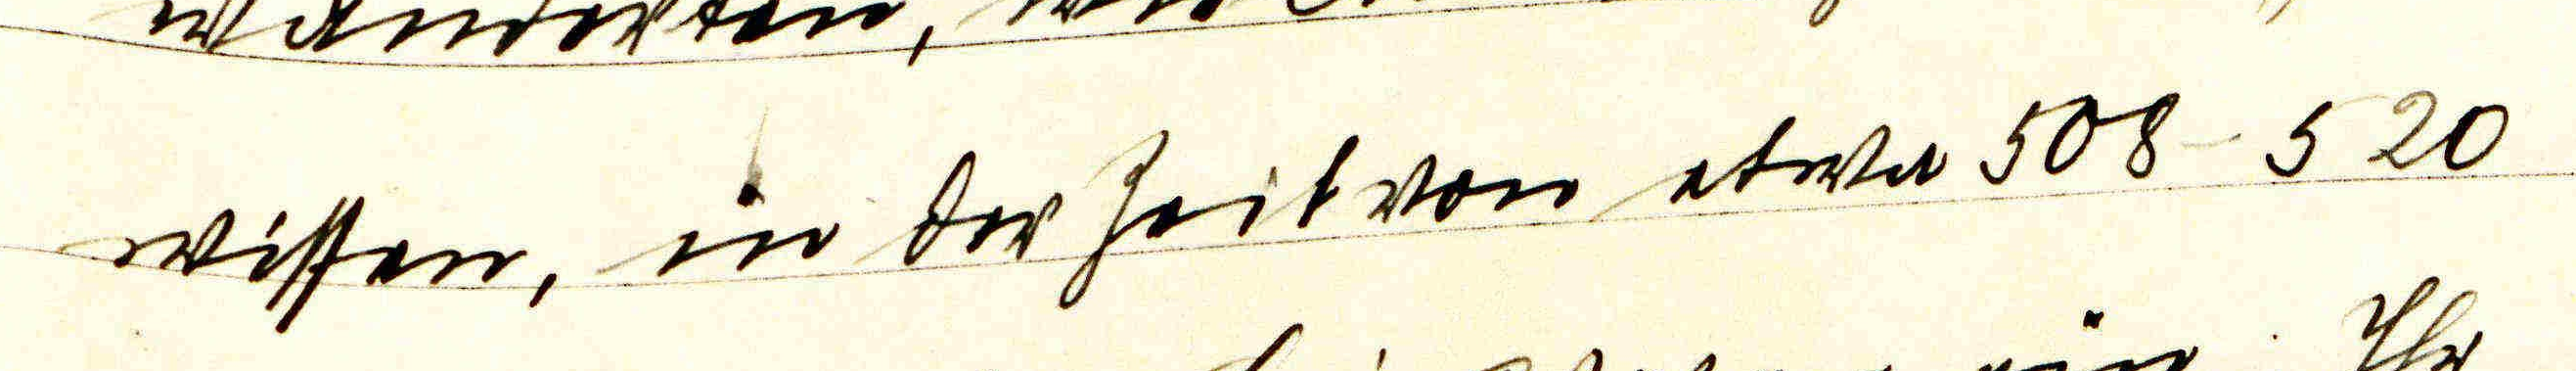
wissen, in der Zeit von etwa 508-520
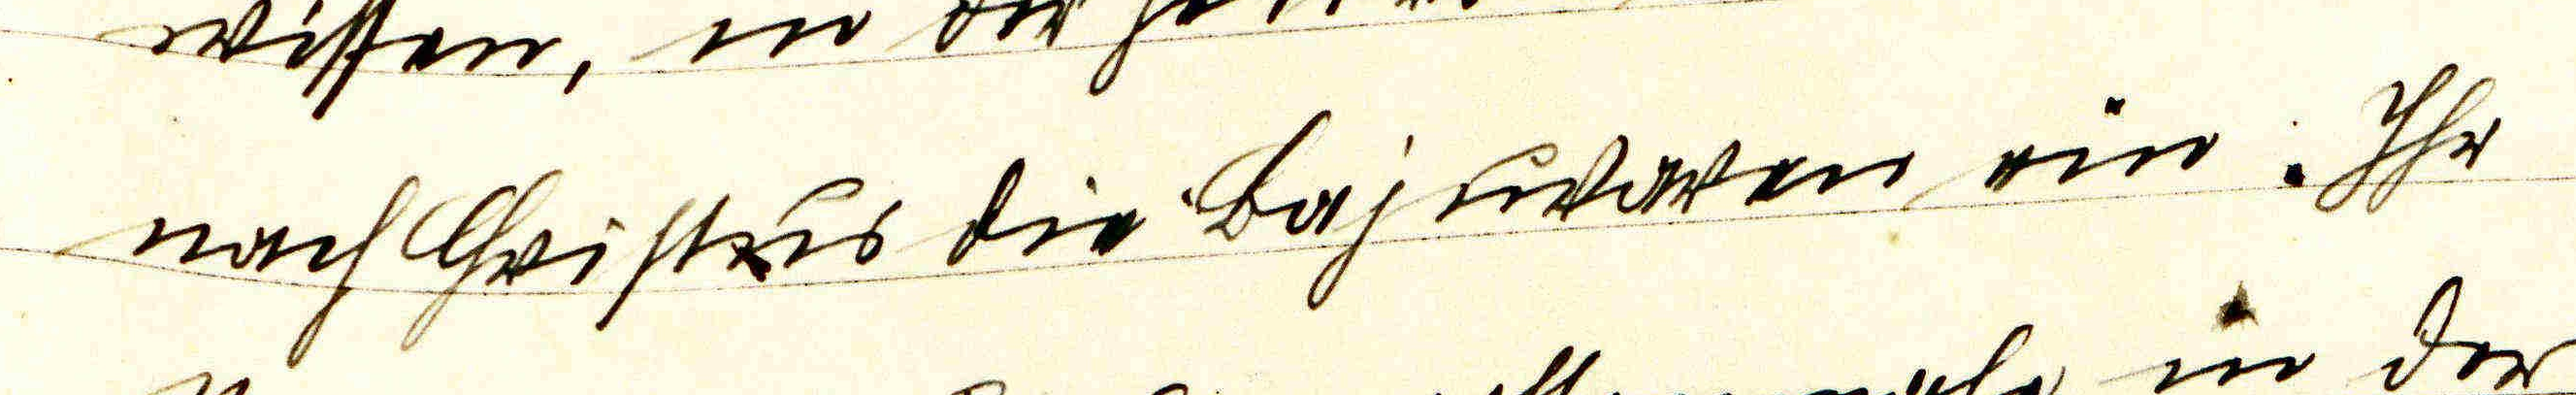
nach Christus die Bajuvaren ein. Ihr
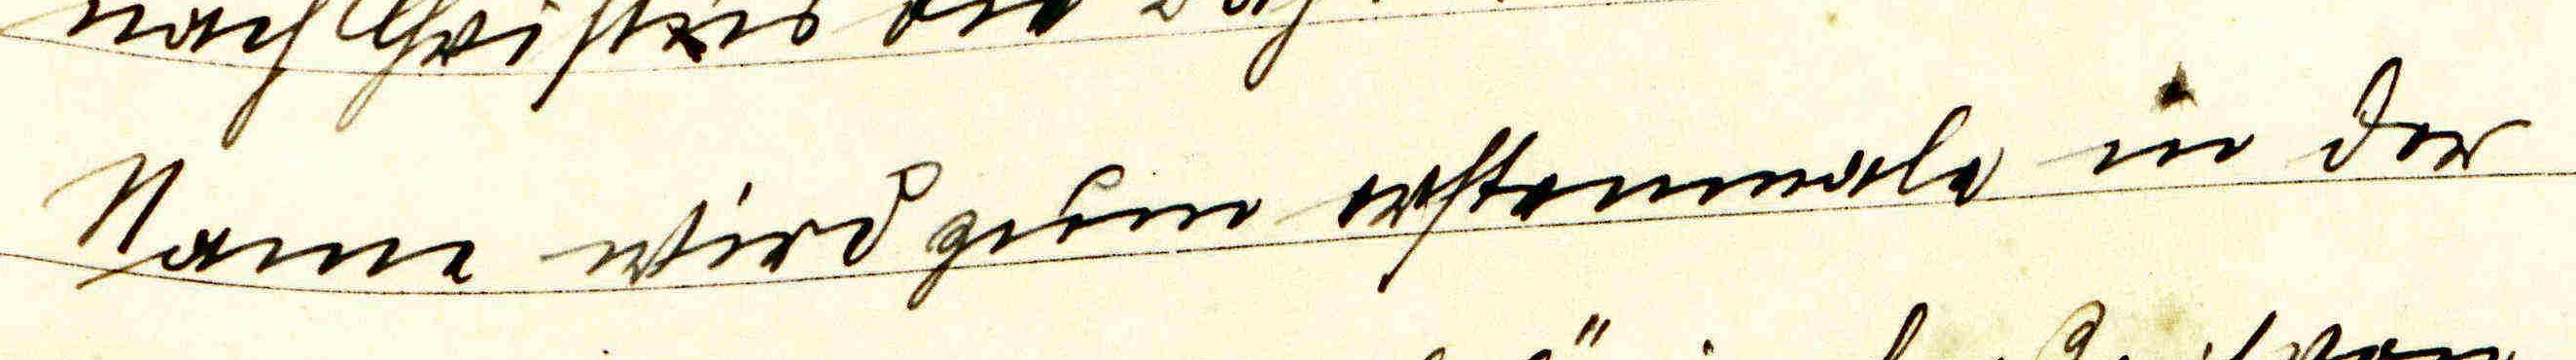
Name wird zum erstenmale in der
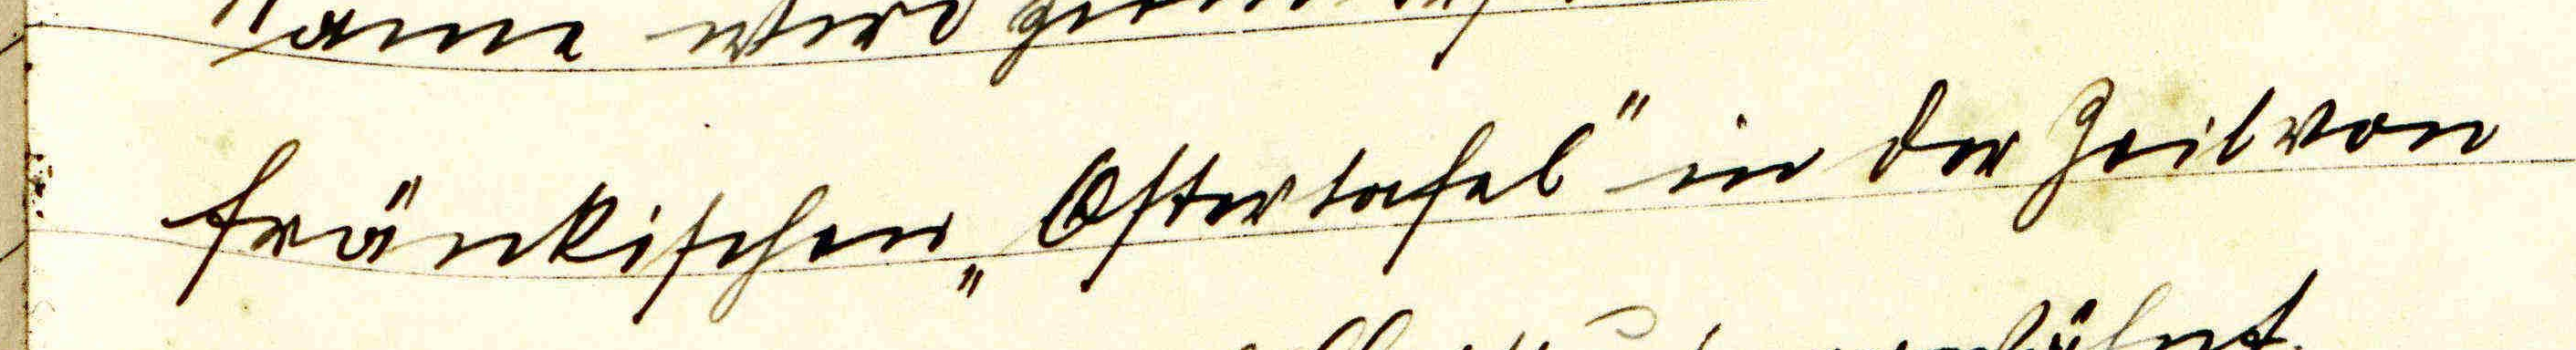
fränkischen „Ostertafel“ in der Zeit von
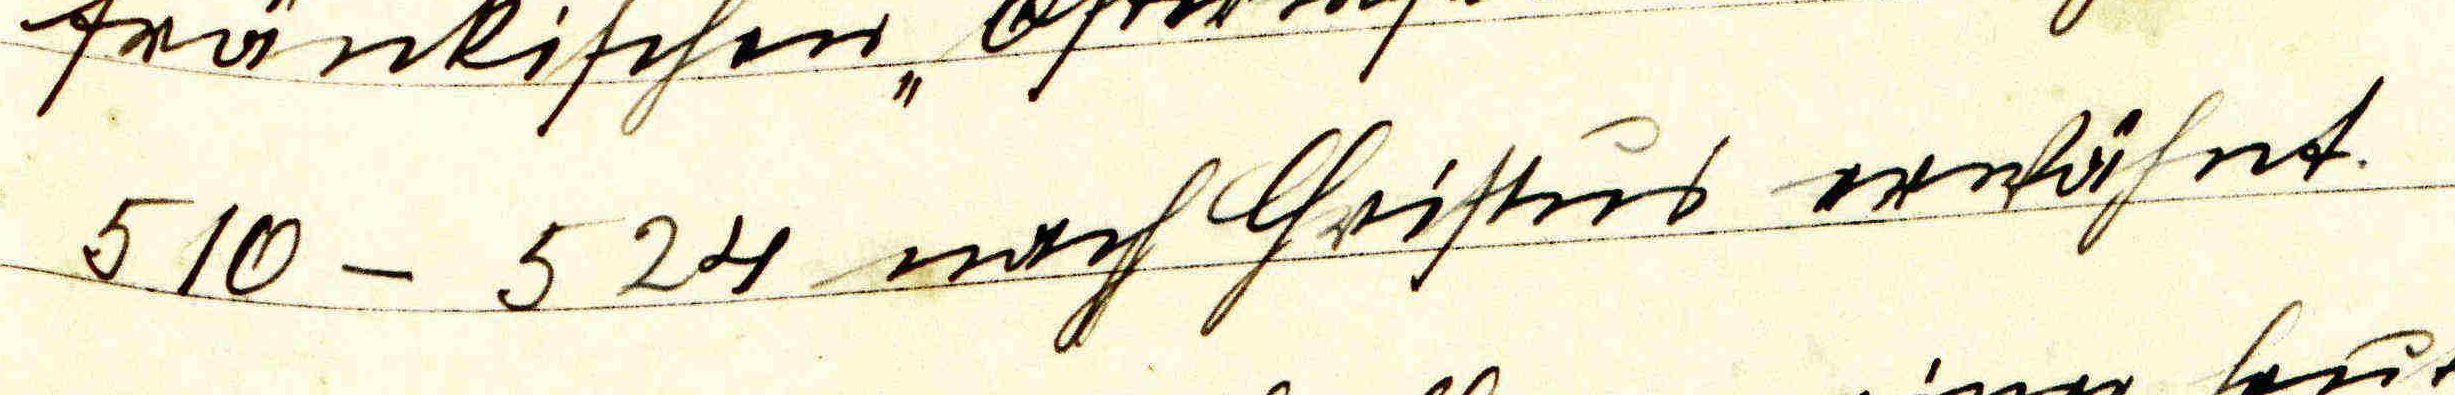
510-524 nach Christus erwähnt.
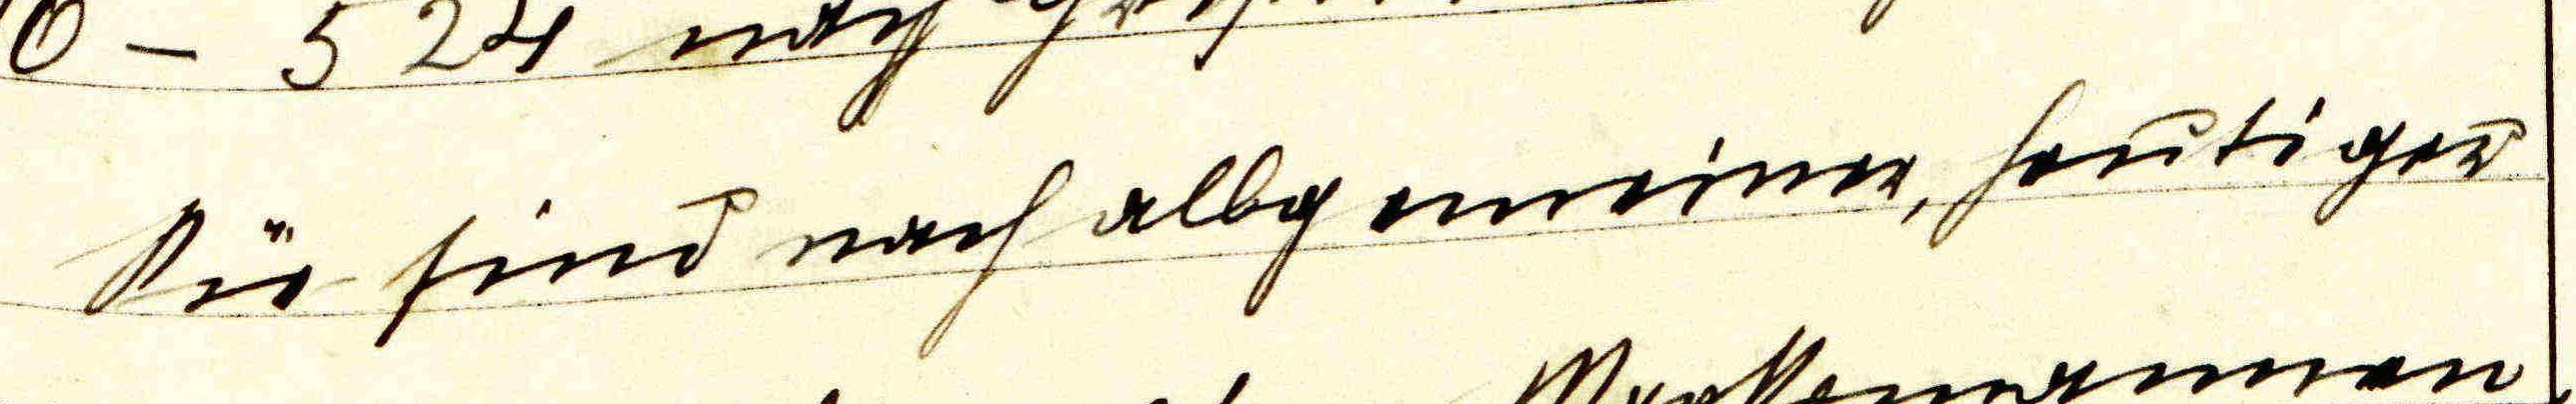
Die sind nach allgemeiner heutiger
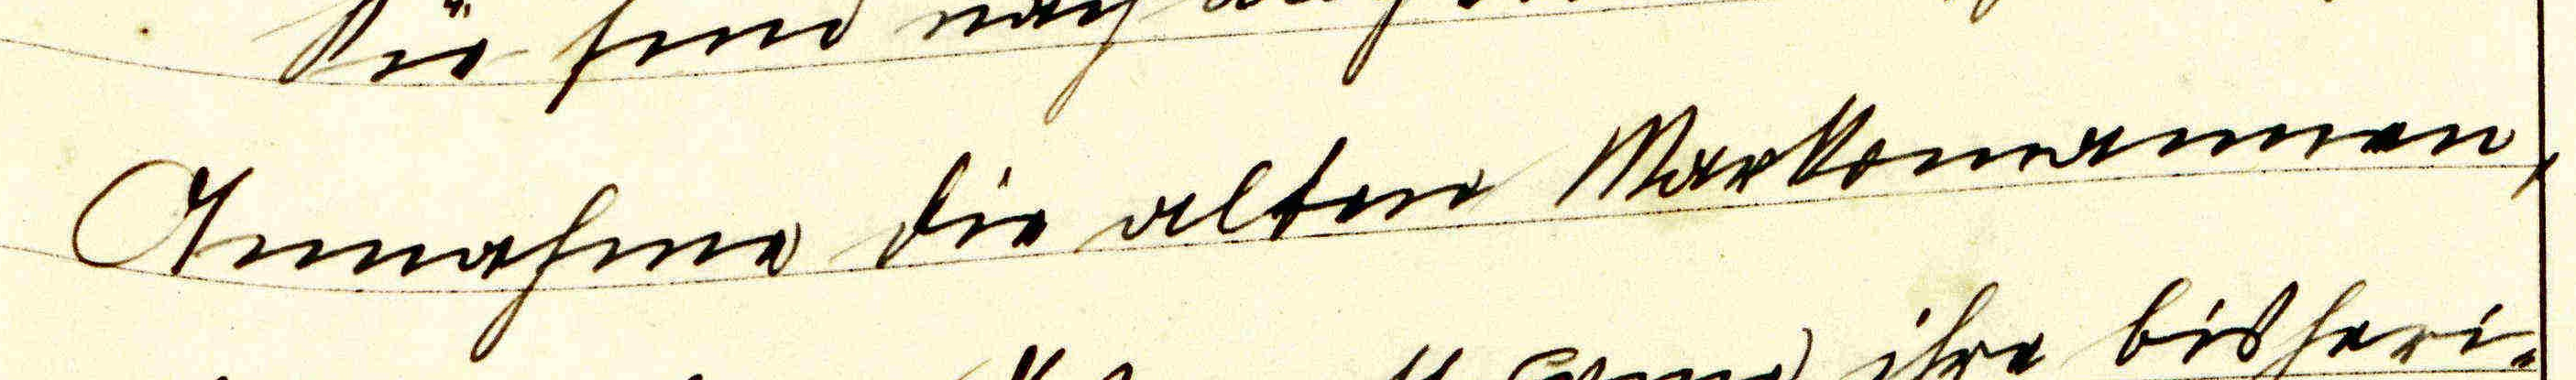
Annahmen die alten Markomannen,
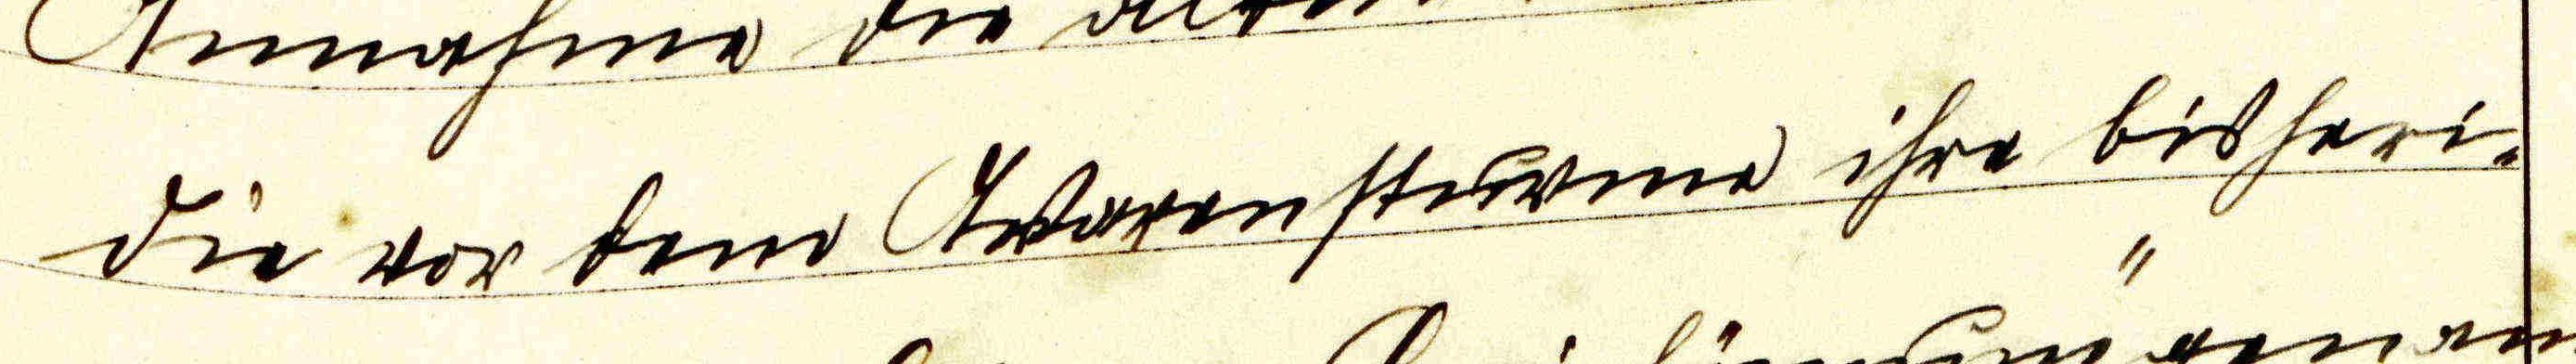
die vor dem Awarensturme ihre bisheri-
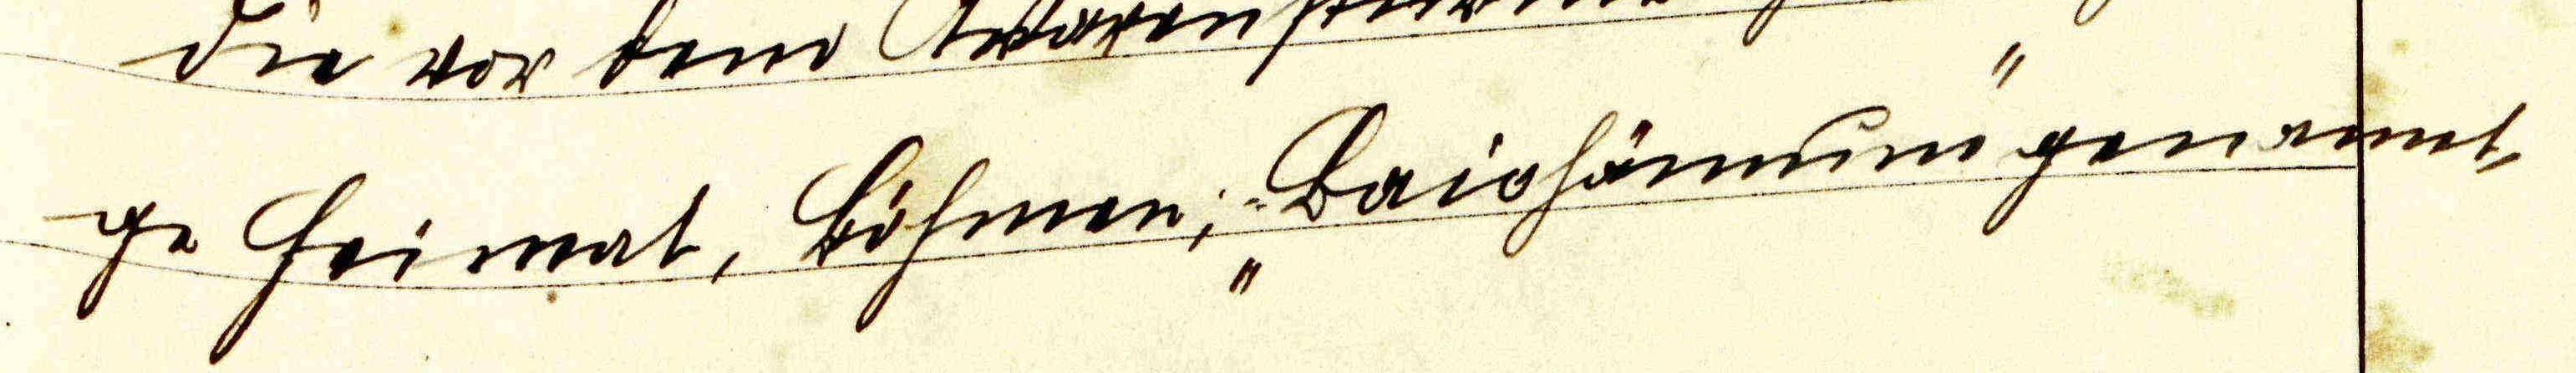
ge Heimat Böhmen „Baiohämum“ genannt
